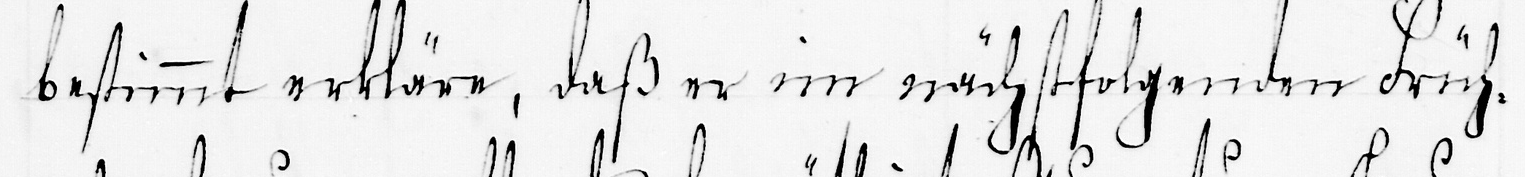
bestimmt erkläre, daß er im nächstfolgenden Früh¬
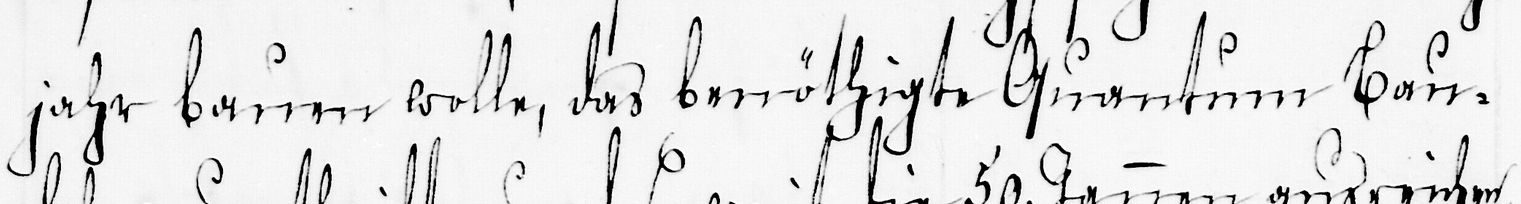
jahr bauen wolle, das benöthigte Quantum Bau¬
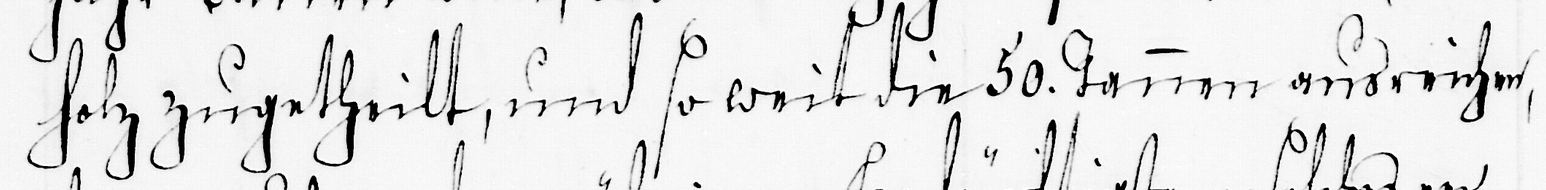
holz zugetheilt, und so weit die 50. Tannen ausreichen,
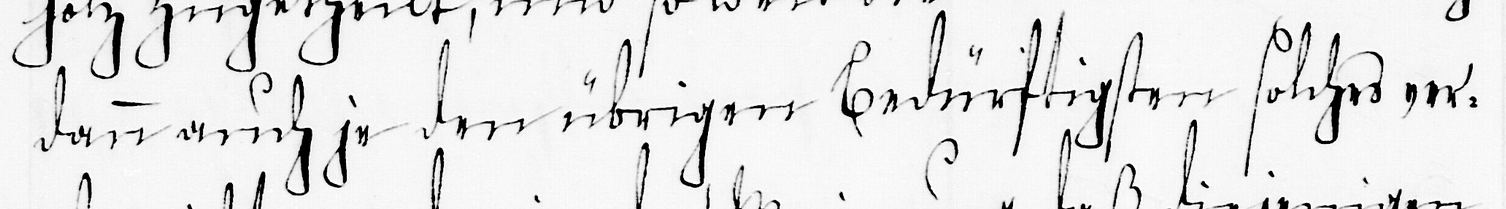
dann auch je den übrigen Bedürftigsten solches ver¬
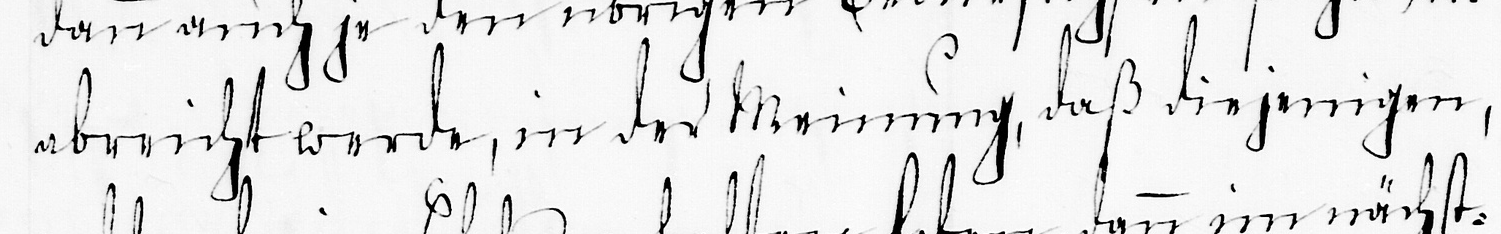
abreicht werde, in der Meinung, daß diejenigen,
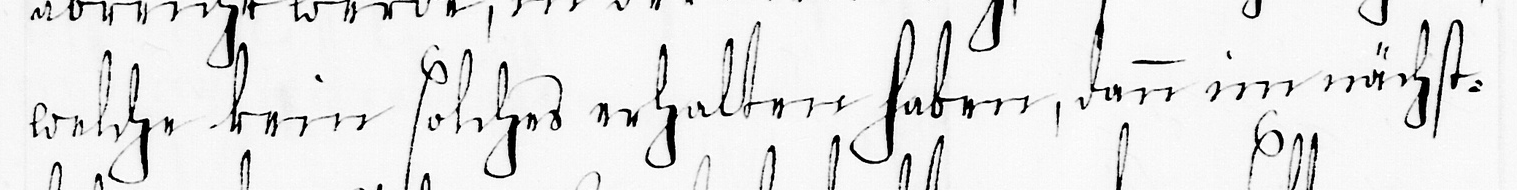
welche kein solches erhalten haben, dann im nächst¬
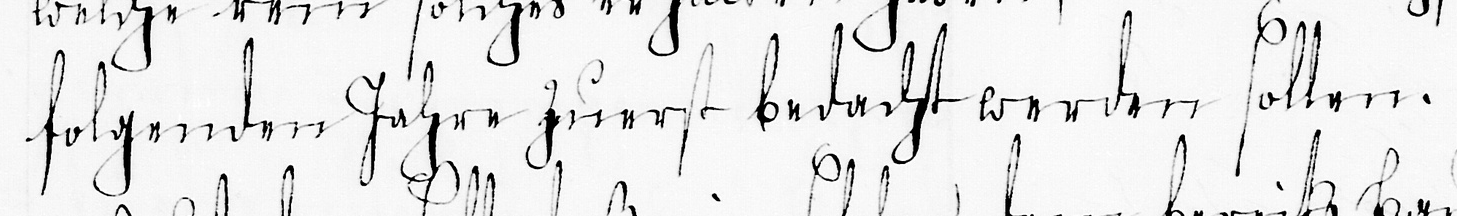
folgenden Jahre zuerst bedacht werden sollen.
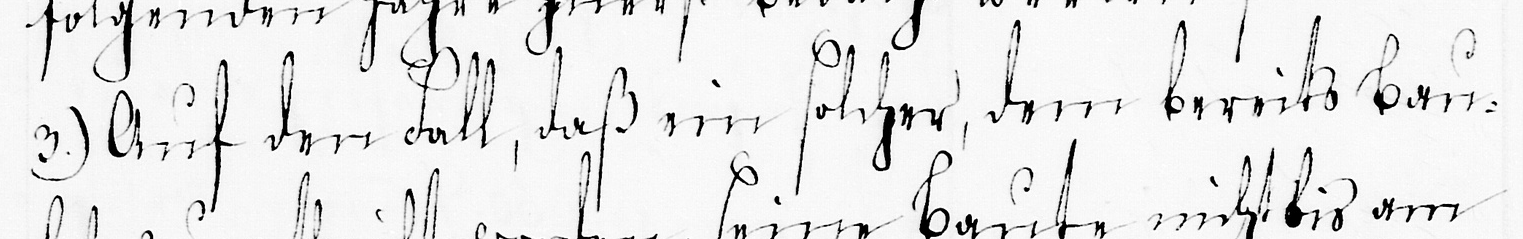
3.) Auf den Fall, daß ein solcher, dem bereits Bau¬
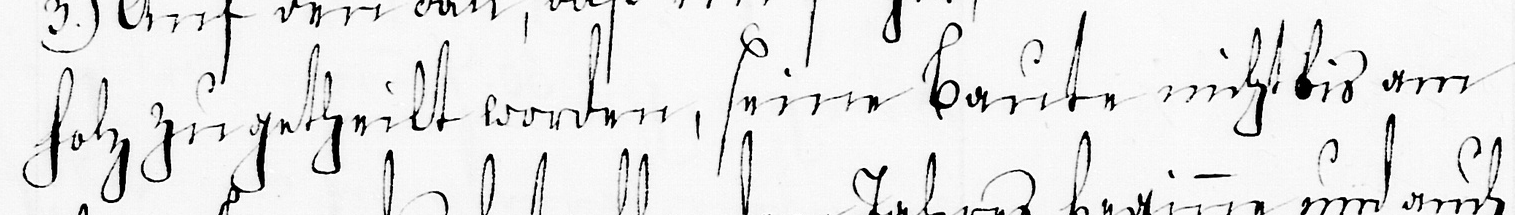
holz zugetheilt worden, seine Baute nicht bis am
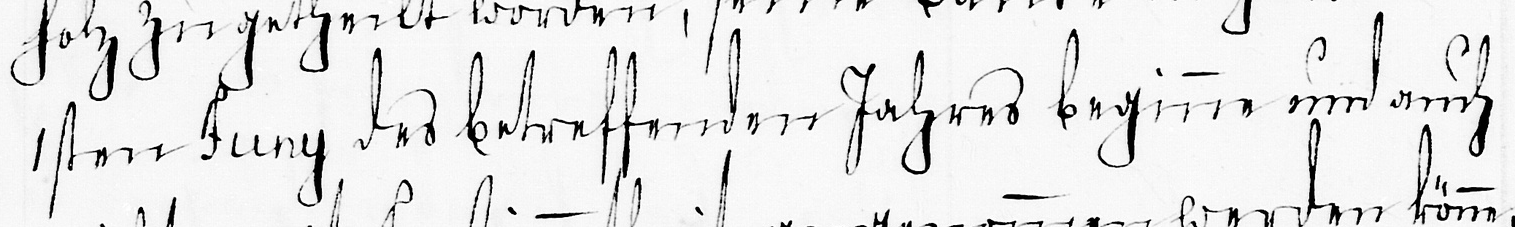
1sten Juny des betreffenden Jahres beginne und auch
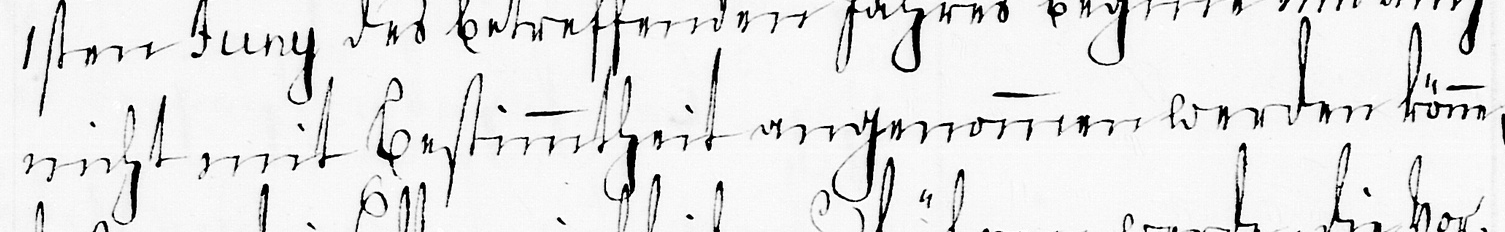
nicht mit Bestimmtheit angenommen werden kön¬
